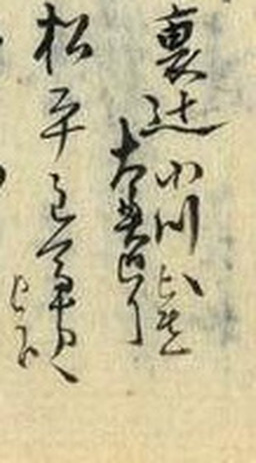大奥廻り
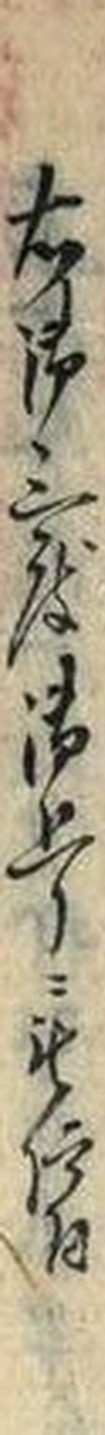右三度御上りニ被仰付
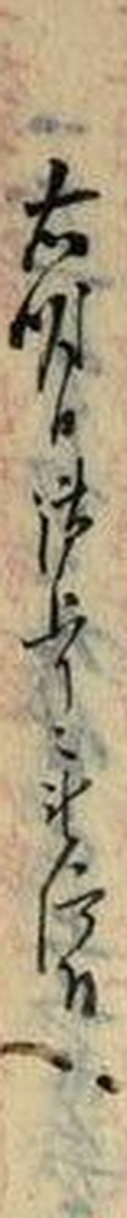右三度御上りニ被仰付

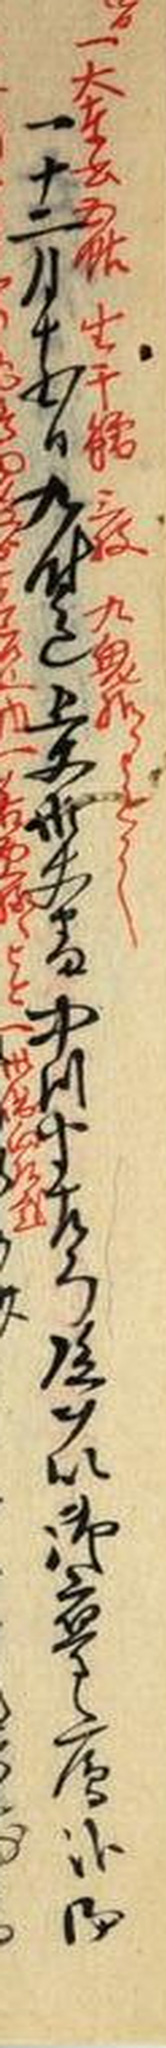一十二月十五日九時過上使御使番中川半左衛門殿ヲ以御鷹之鳫弐御
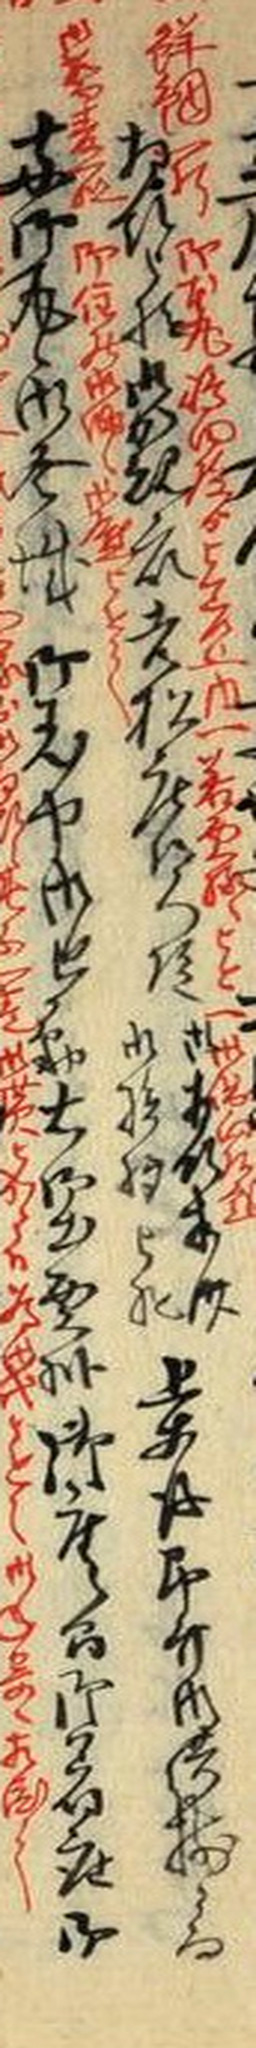両御丸へ御登城御老中御廻勤右御出殿掛御座之間御着座御
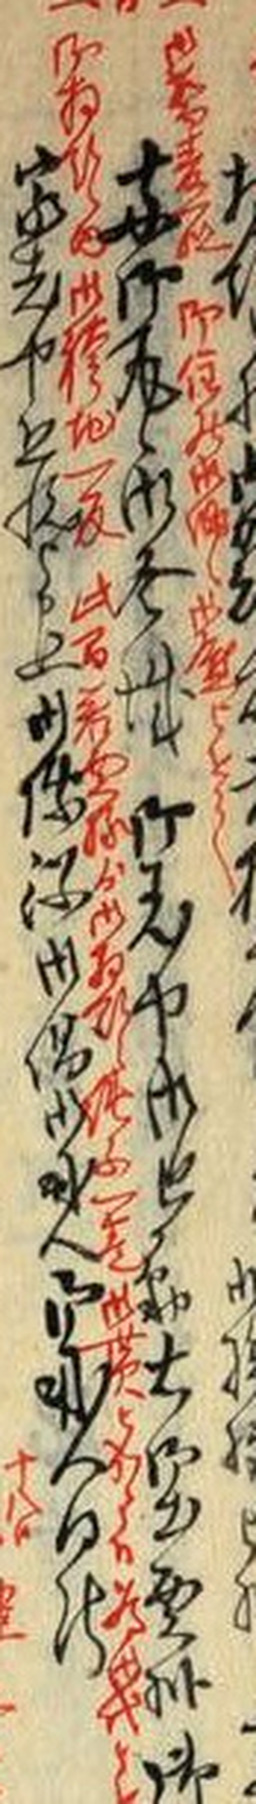家老中恐悦被申上御傅役御側御用人御用人同断
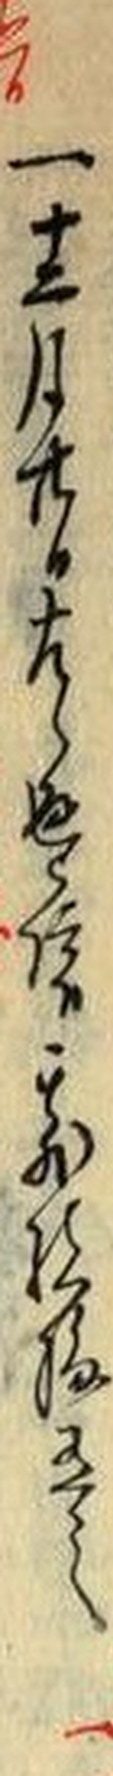一十二月廿日左之通被仰付其外結構有之
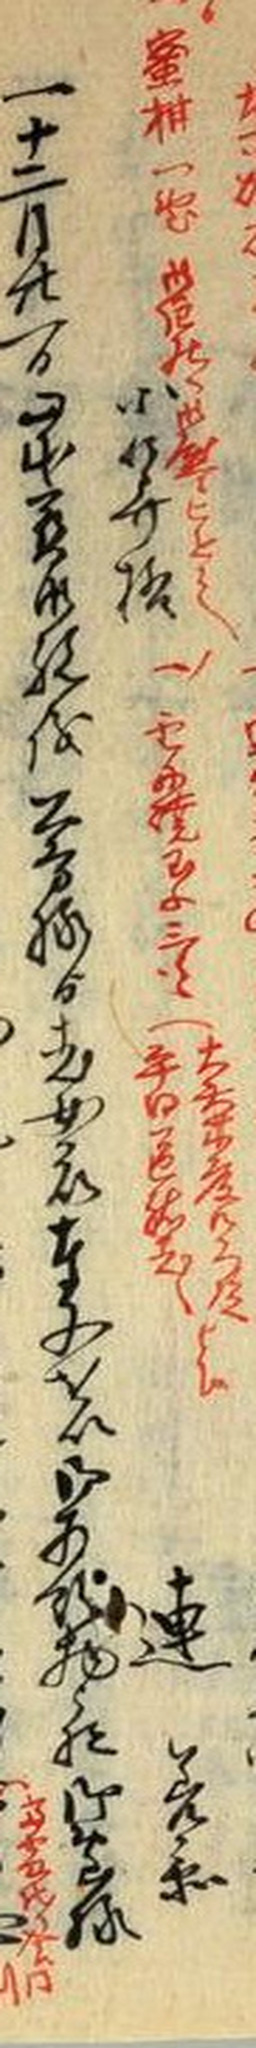一十二月廿一日歳暮御祝儀公方様ゟ老女衆奉文を以御拝領物被遊御台様
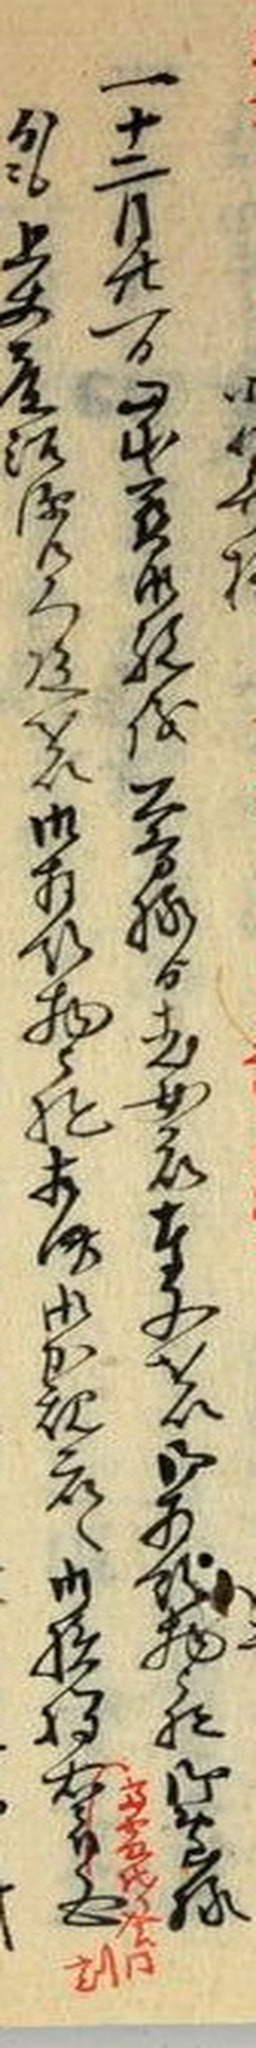ゟも上使藤沼源左衛門殿を以御拝領物被遊相済御加規衆へ御挨拶右ニ付五
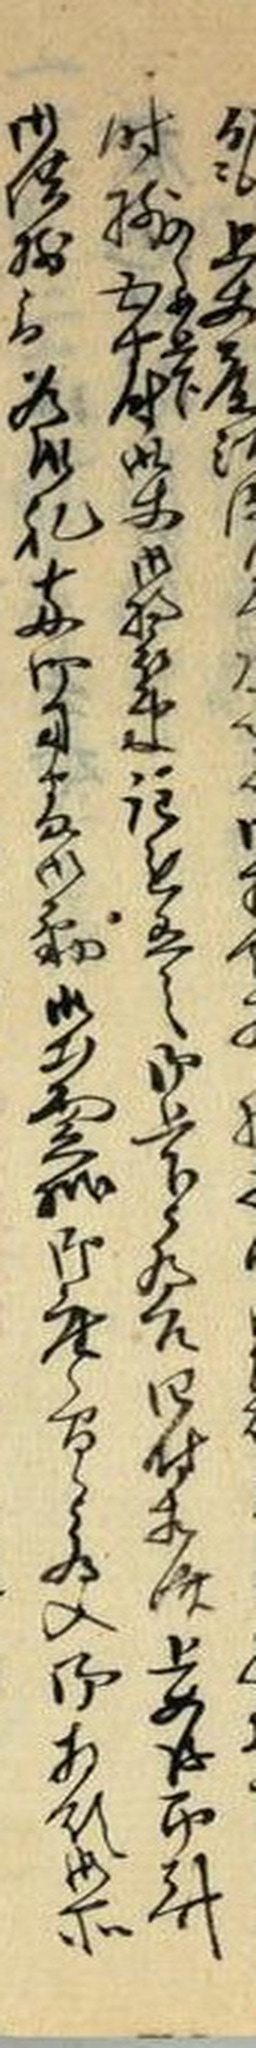御供揃ニ而為御礼両御用番御勤御出殿掛御座之間へ被為入御拝領御品
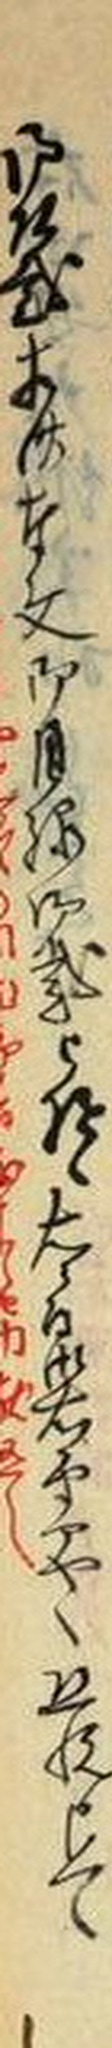御頂戴相済奉文御目録御戴被遊候右ニ付御右筆部やへ恐悦申上候
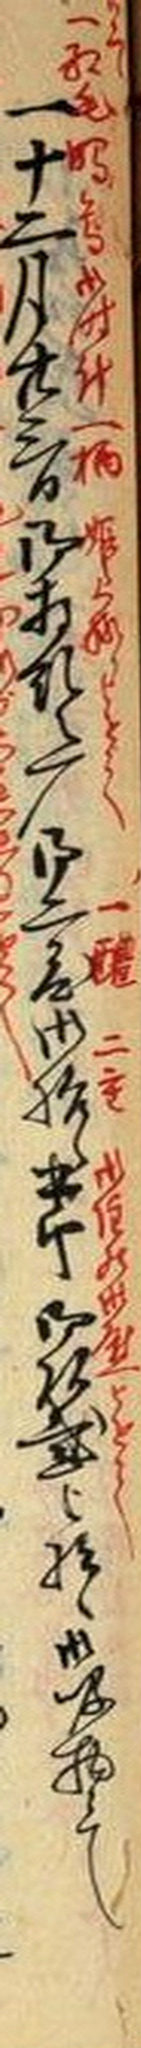一十二月廿三日御拝領之雁御二度御之節御頂戴被遊候御吸物ニて
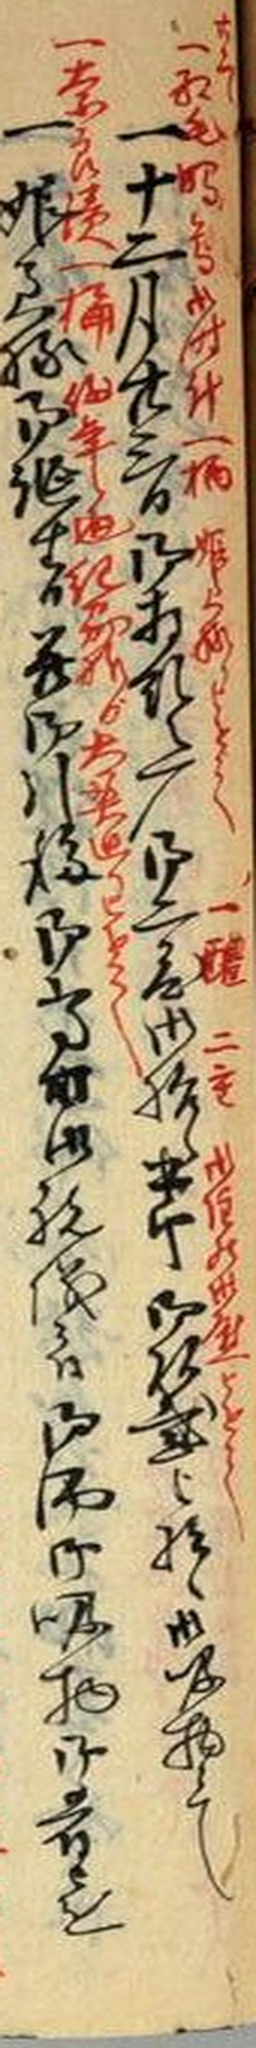一姫君様御誕生日并御引移御当日御祝儀ニ付御酒御吸物御肴被進
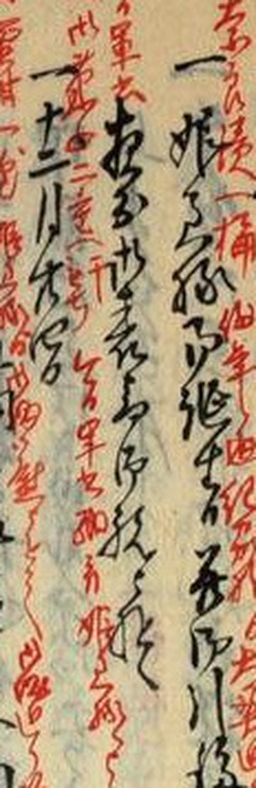夜分御表ニ而御祝被遊候
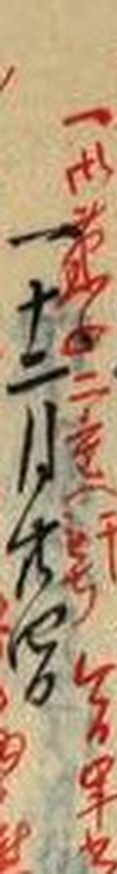一十二月廿四日
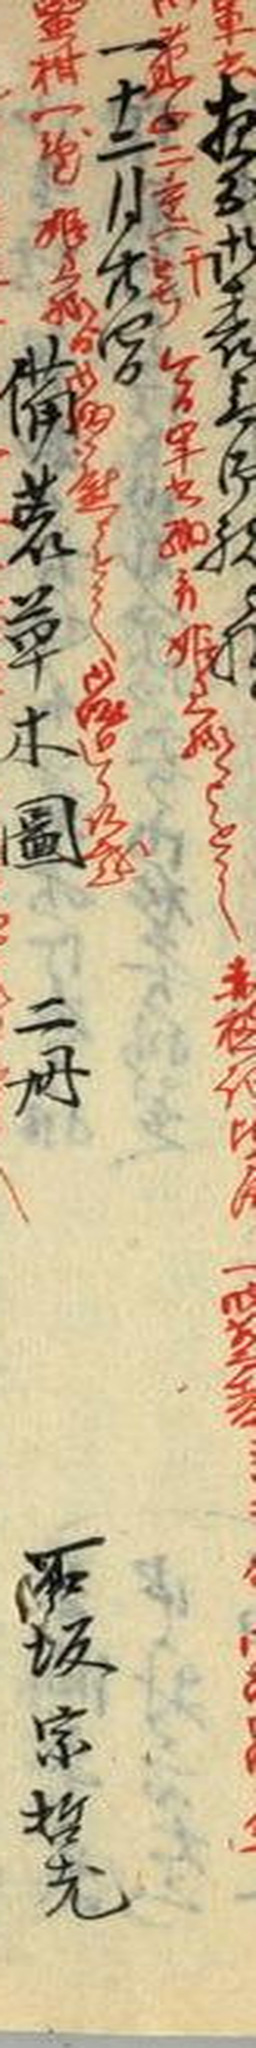備荒草木図二冊石坂宗哲老
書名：少傅日録抄（斉承付側向頭取日記、在府）
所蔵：福井県文書館 Fukui Prefectural Archives
